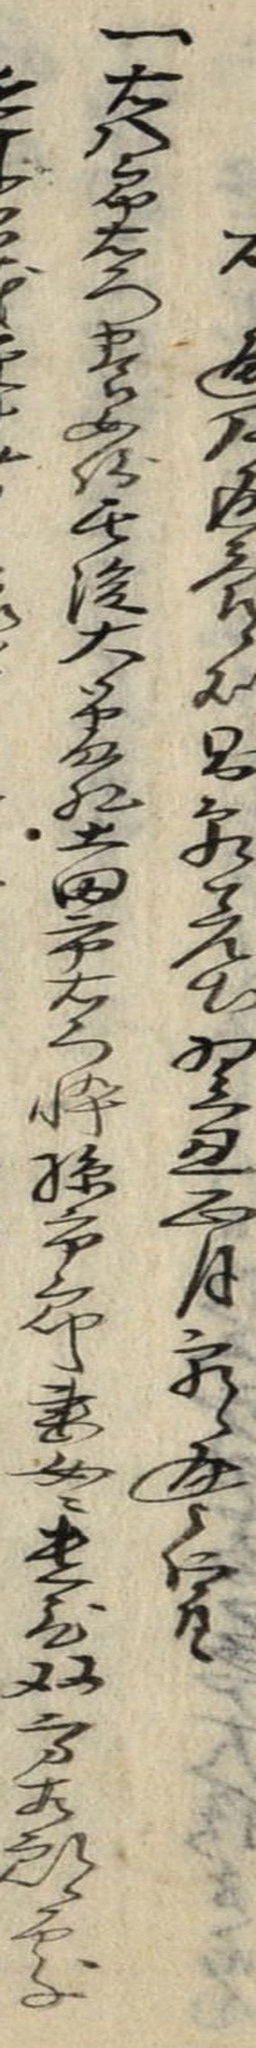一右八郎右衛門養女儀其後大御番組土田市右衛門倅孫市郎妻女ニ遣度双方相願候処
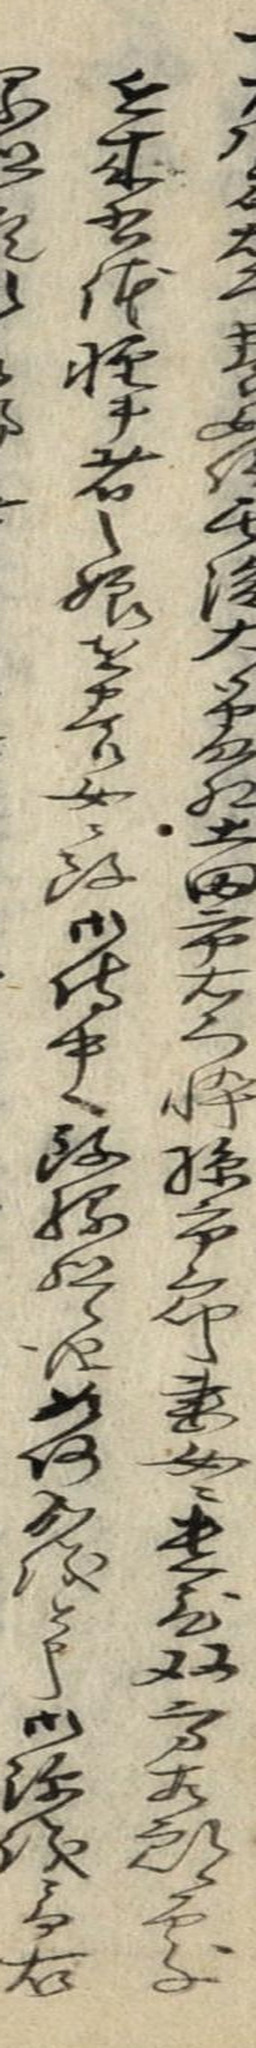近来右体軽キ者之娘を養女ニ致御侍中へ致縁組候儀如何成儀と申候御評議ニ而右
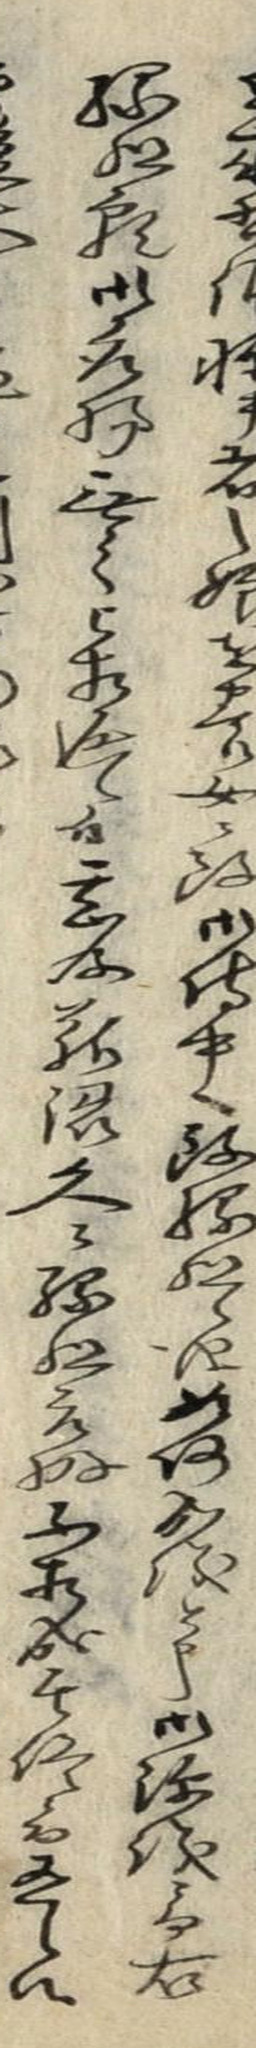縁組願御取揚無之被相返候ニ付甚及難渋久々縁組取扱不相成其儘ニ而有之候
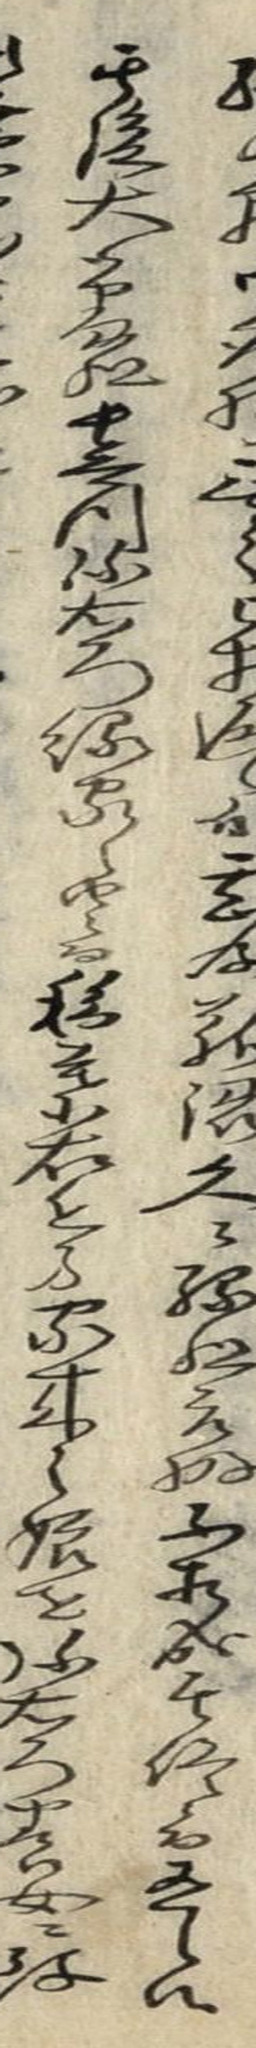其後大御番組長谷川弥右衛門縁家之由ニ而稲葉右近方家来之娘を弥右衛門養女ニ致
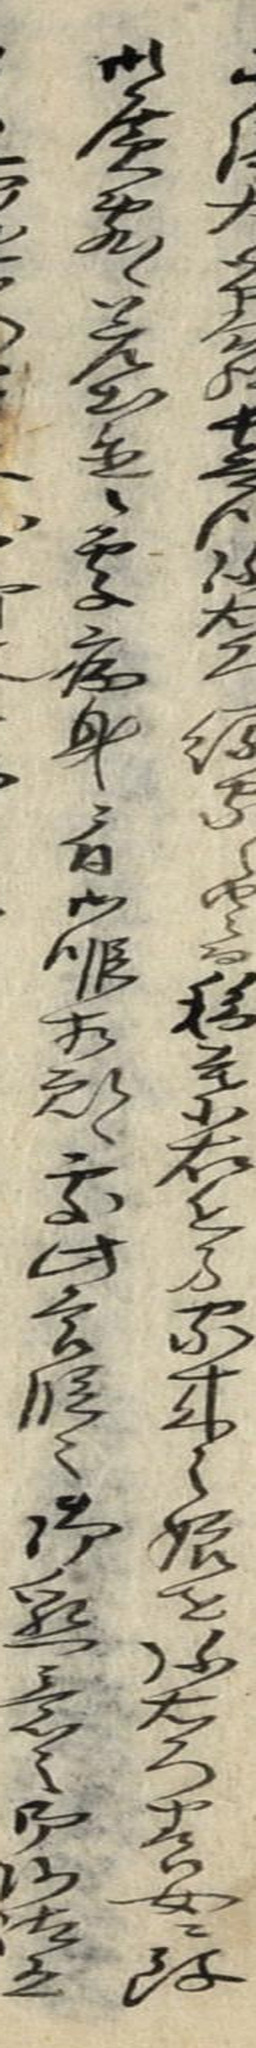御広敷ヘ差出置候処病身ニ付御暇相願候処此節段々御懇意之御沙汰有
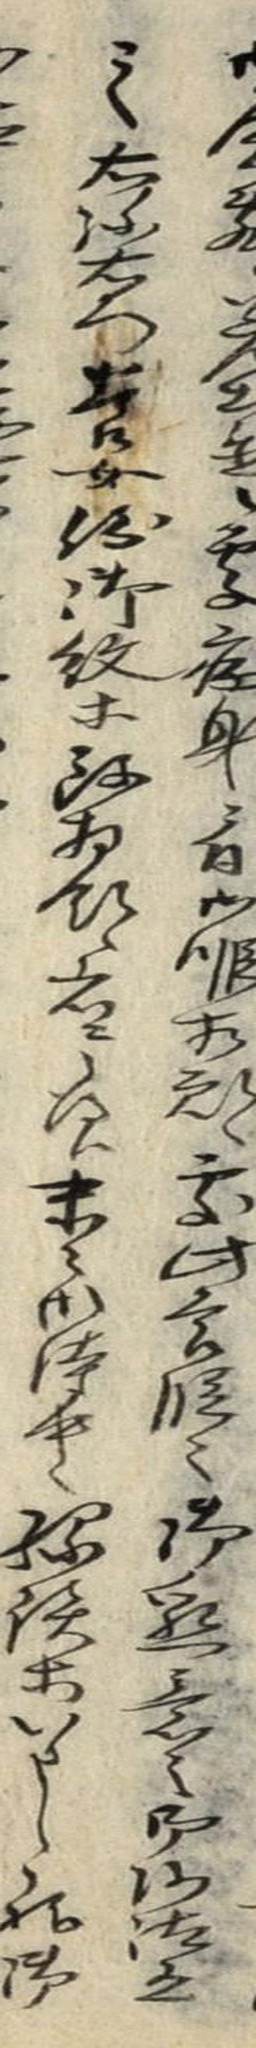之右弥右衛門養女儀御紋等致拝領候者ニ候得ハ末々御侍中へ縁談等いたし候様御
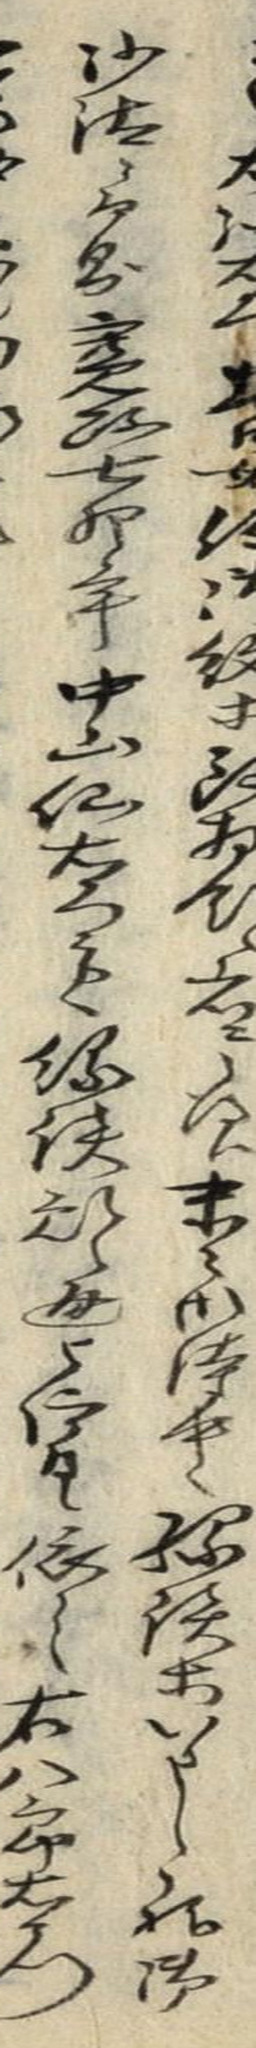沙汰ニ而則寛政七卯年中山仙右衛門方へ縁談願之通被仰付候依之右八郎右衛門
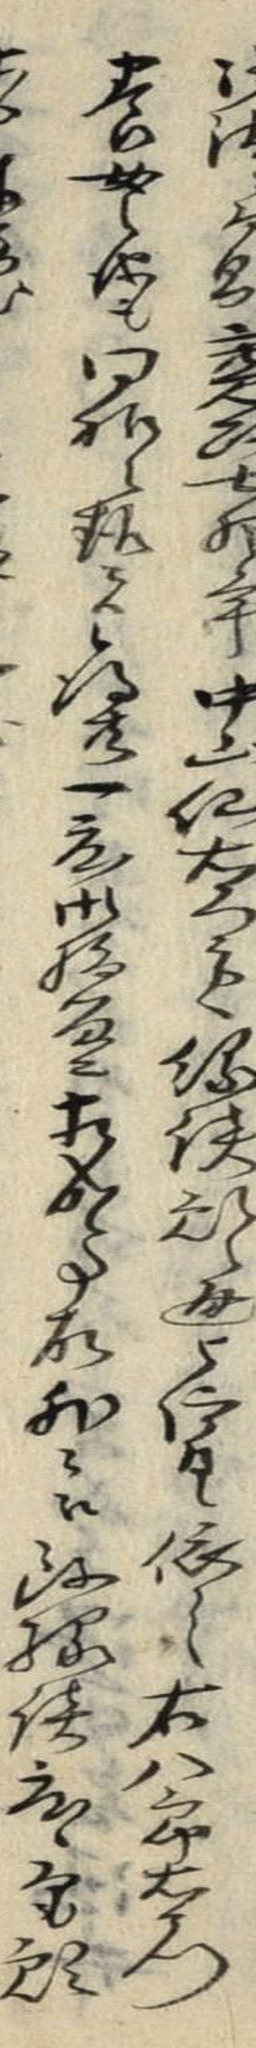養女之儀も同様之趣ニハ候得共一度御指留ニ相成候事故外々え致縁談度候而も願
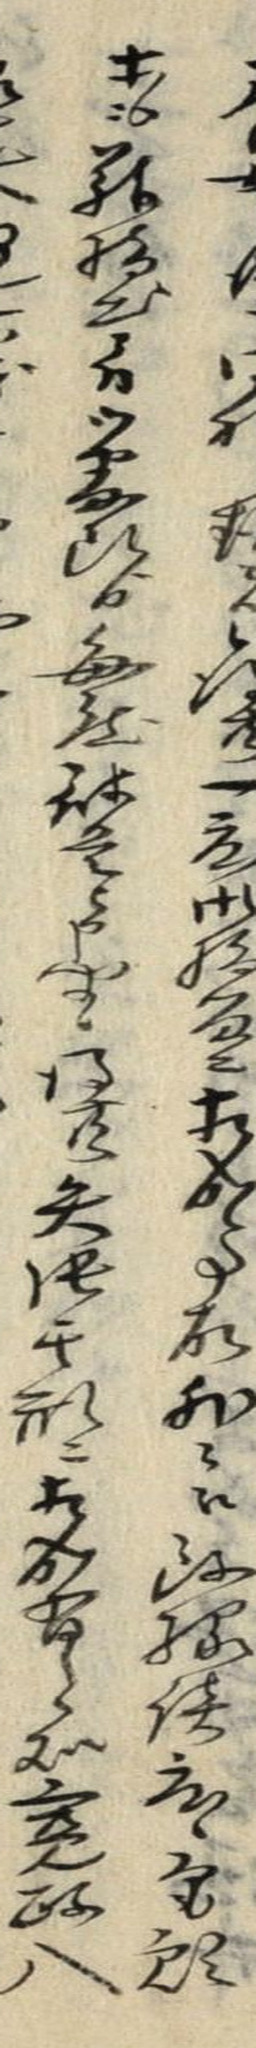等も難指出ニ付御番頭ゟ毎度彼是被申聞候得共矢張其形ニ相成有之候処寛政八
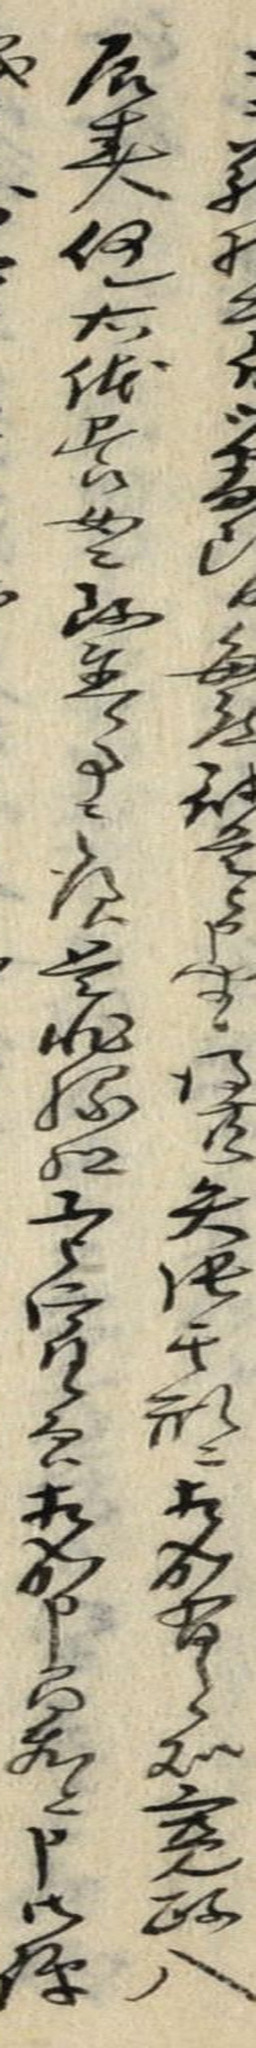辰春何レ右体養女と致置候事ニ候得ハ是非縁組不被仰付候而ハ相成間敷と申御評
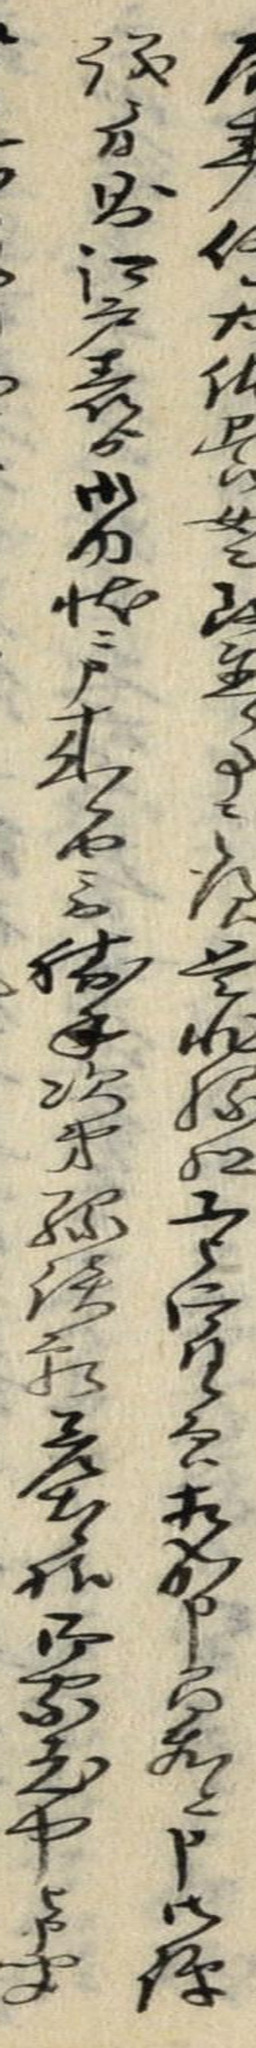議ニ付則江戸表ゟ御内状二申来候由ニ而勝手次第縁談願差出候様御家老中被申聞
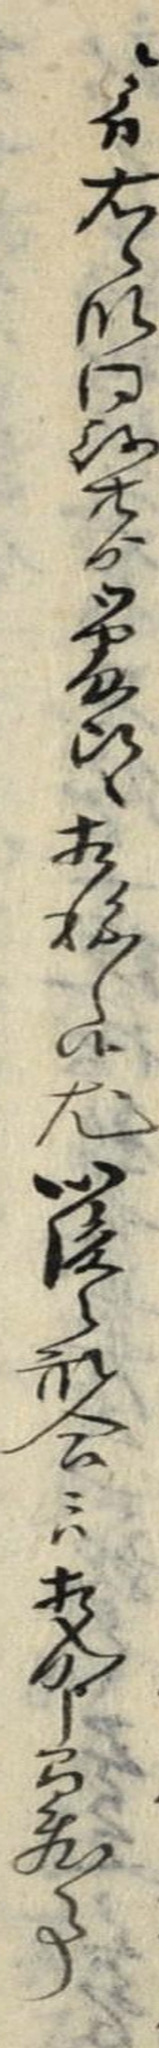候ニ付右之段同役共ゟ御番頭へ相移し候尤以後之形合ニハ相成申間敷事
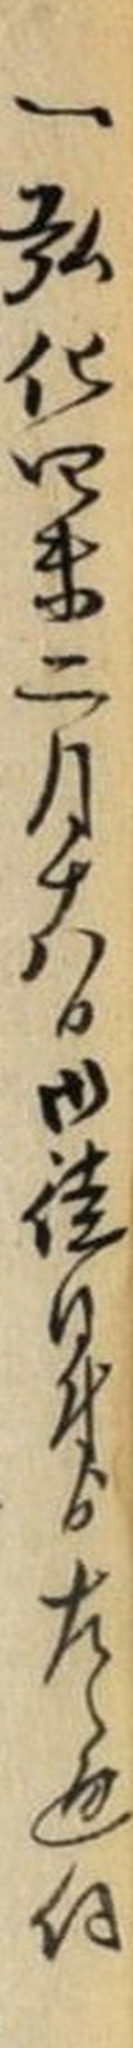一弘化四未二月十八日御徒目付ゟ左之通伺
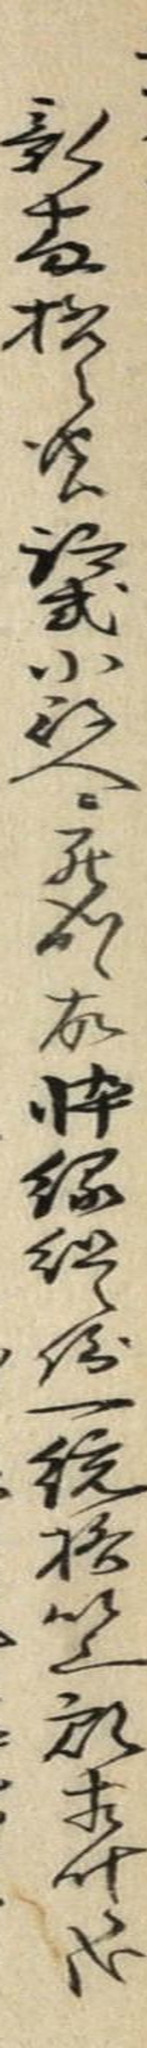新番格之儀ハ跡式小役人ニ罷成候故倅縁組之儀一統格以上願相叶候哉
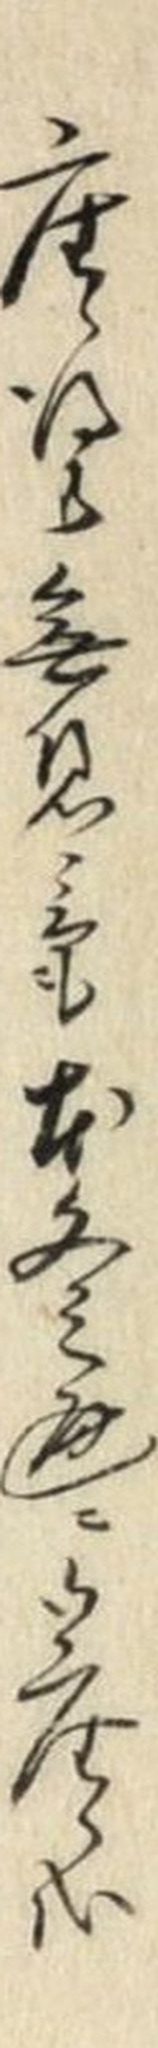座候得共無息ニ而も本文之通ニ御座候哉
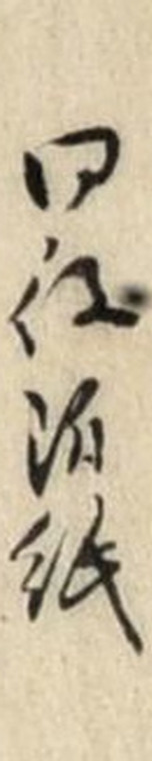同役附紙
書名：養子縁組之部
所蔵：福井県文書館 Fukui Prefectural Archives
